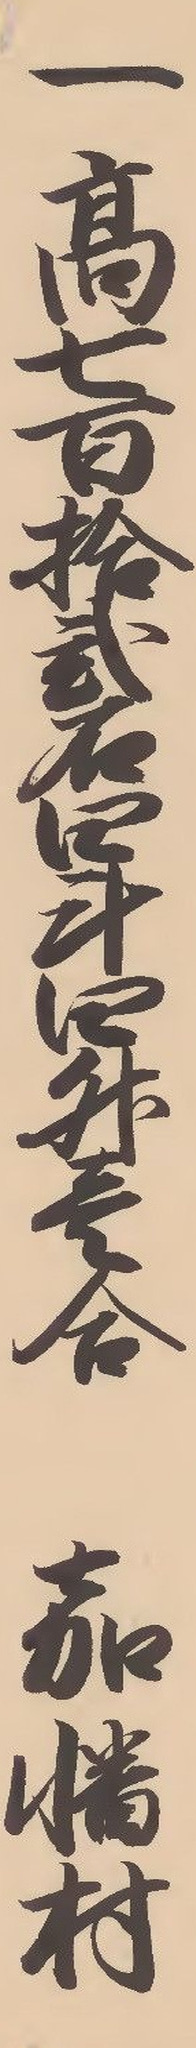一高七百拾弐石四斗四升壱合嘉幡村
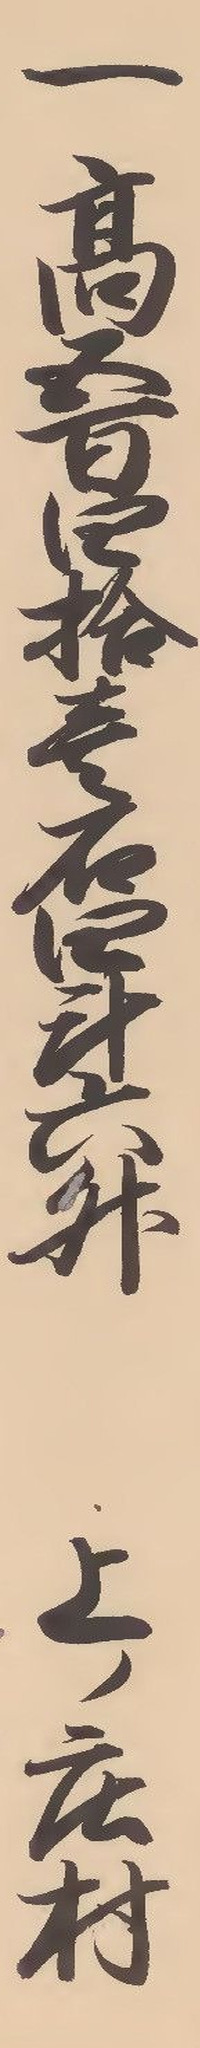一高五百四拾壱石四斗六升上ノ庄村
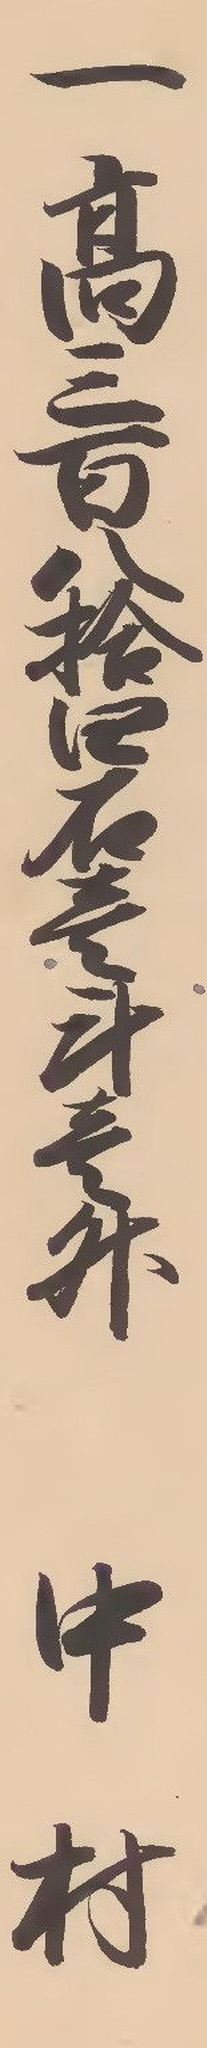一高三百八拾四石壱斗壱升中村
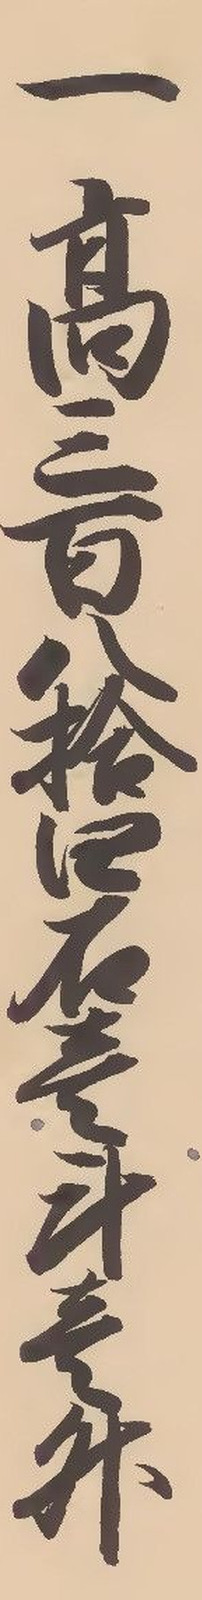一高三百八拾四石壱斗壱升中村

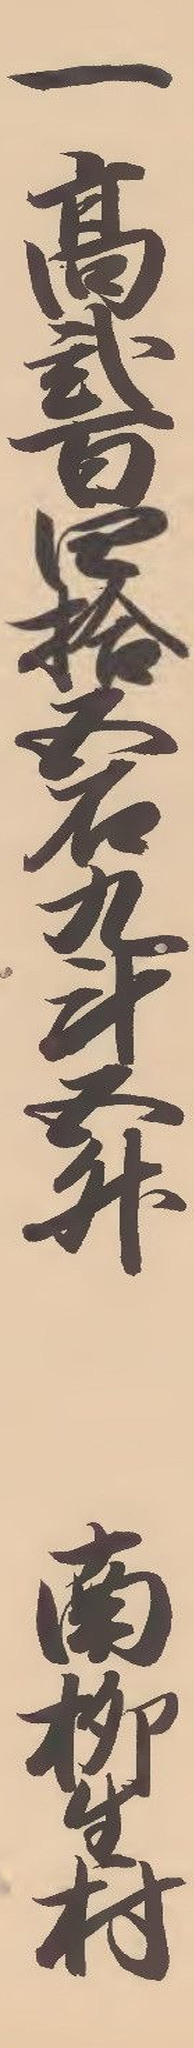一高弐百四拾五石九斗五升南柳生村
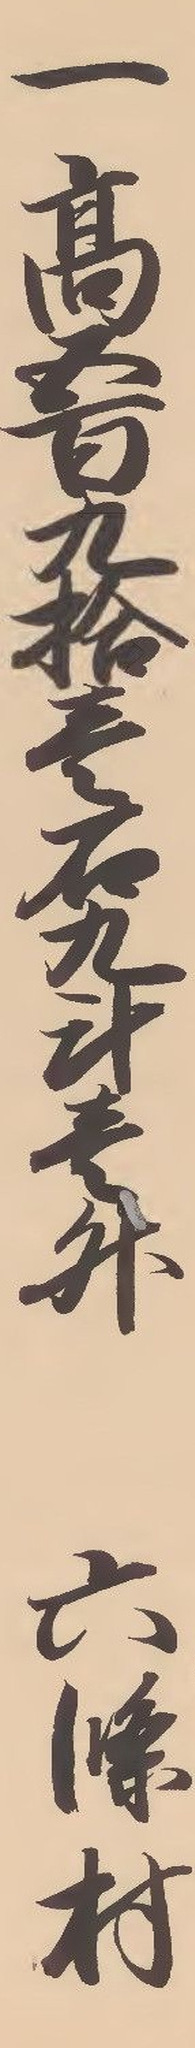一高五百九拾壱石九斗壱升六条村
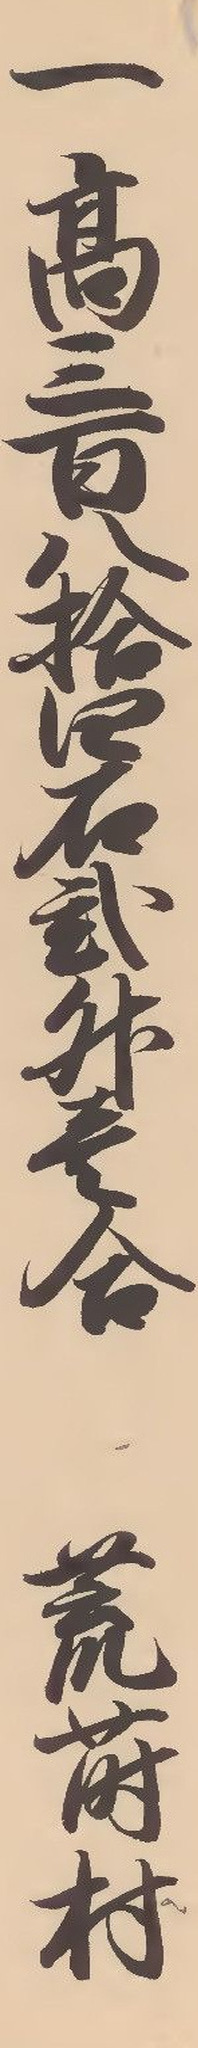一高三百八拾四石弐升壱合荒蒔村
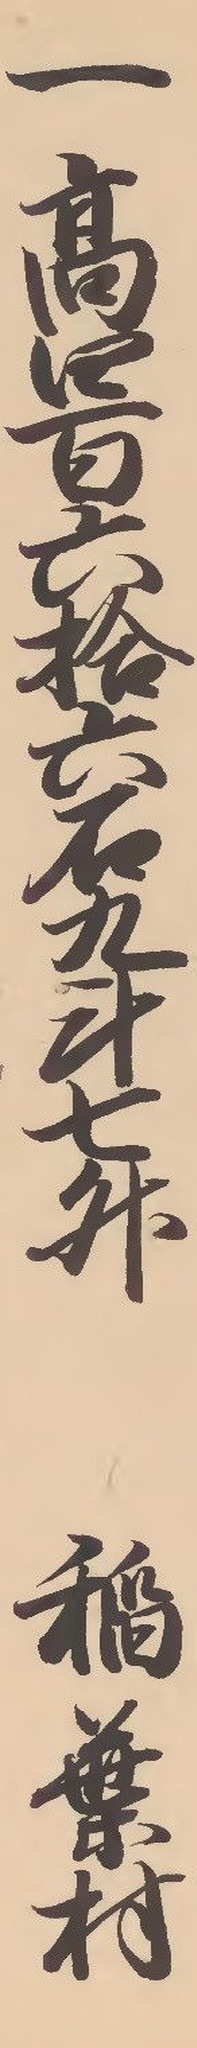一高四百六拾六石九斗七升稲葉村
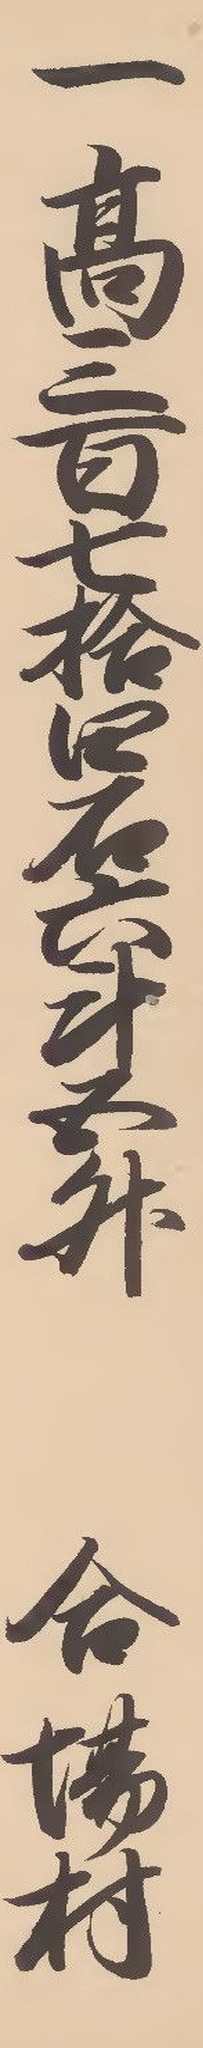一高三百七拾四石六斗五升合場村
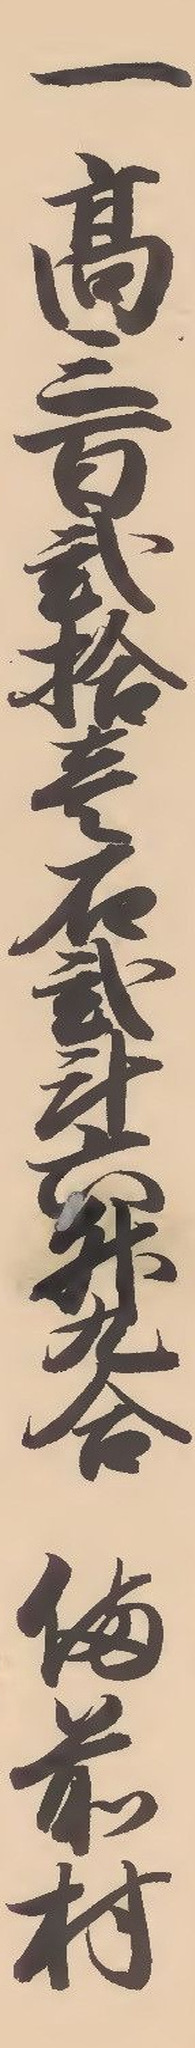一高三百弐拾壱石弐斗六升九合備前村
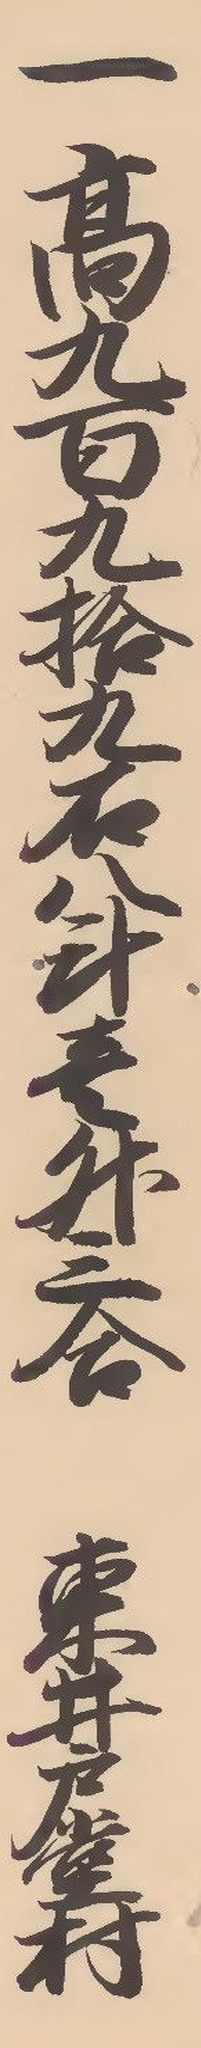一高九百九拾九石八斗壱升三合東井戸堂村

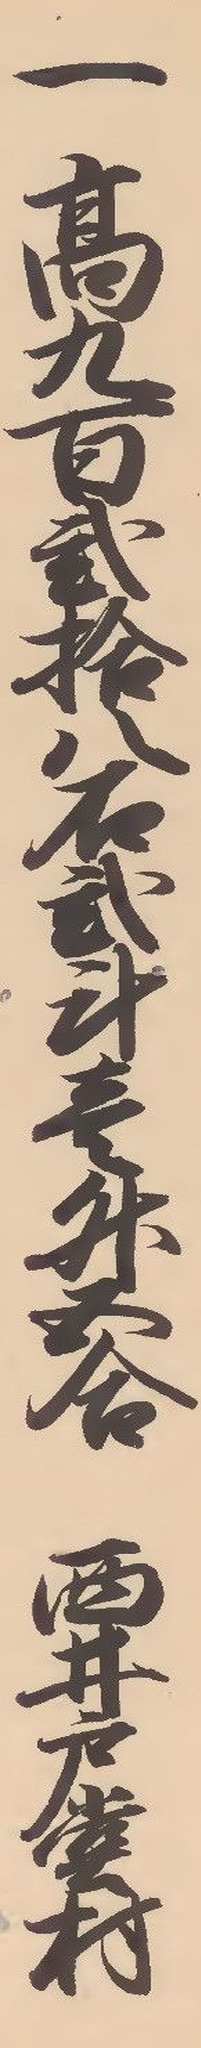一高九百弐拾八石弐斗壱升五合西井戸堂村
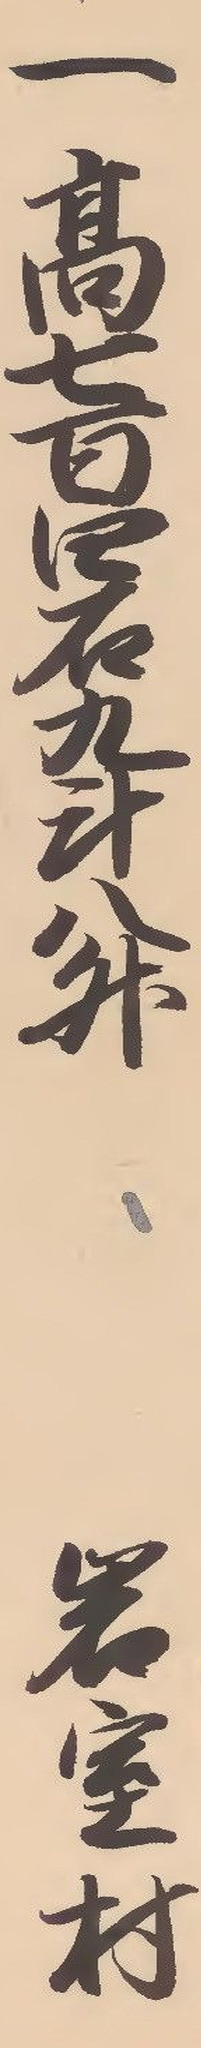一高七百四石九斗八升岩室村
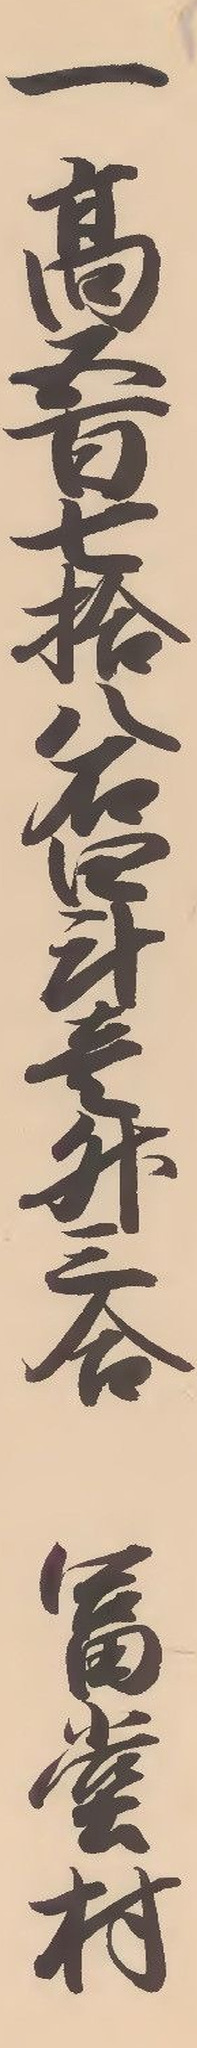一高五百七拾八石四斗壱升三合富堂村
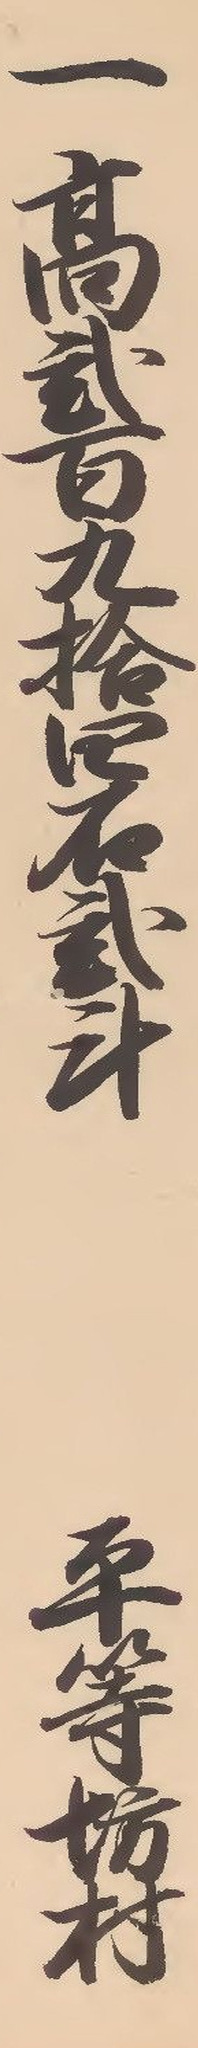一高弐百九拾四石弐斗平等坊村
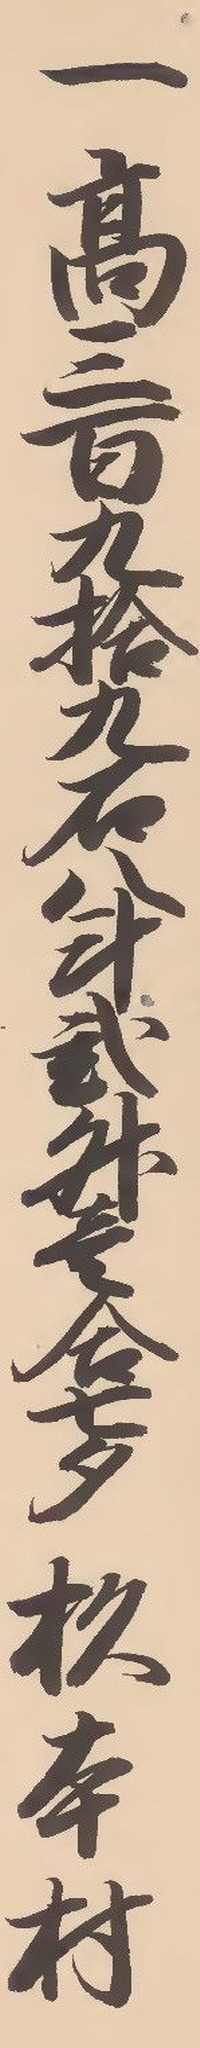一高三百九拾九石八斗弐升壱合七勺杉本村
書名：大和国郷帳
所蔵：国立公文書館 National Archives of Japan
